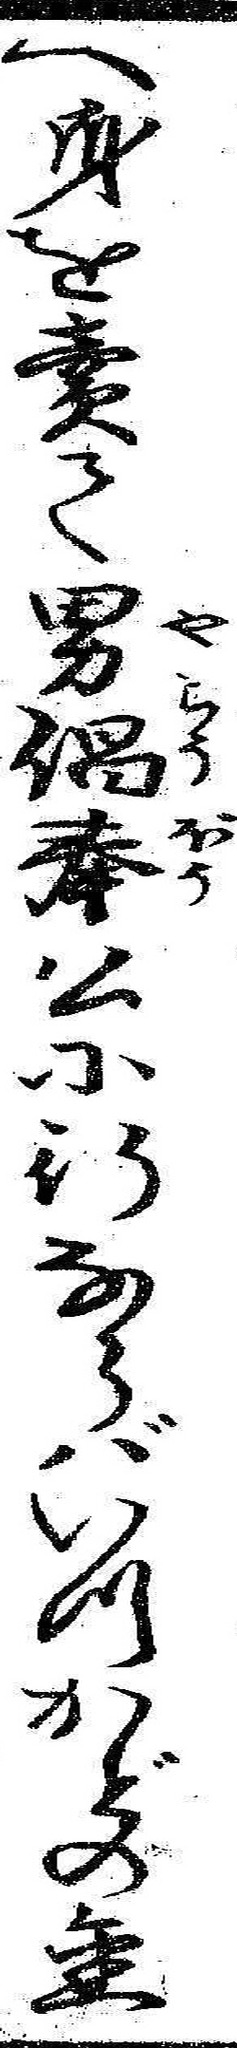へ身を売て男倡奉公に行ならばいつかどの金
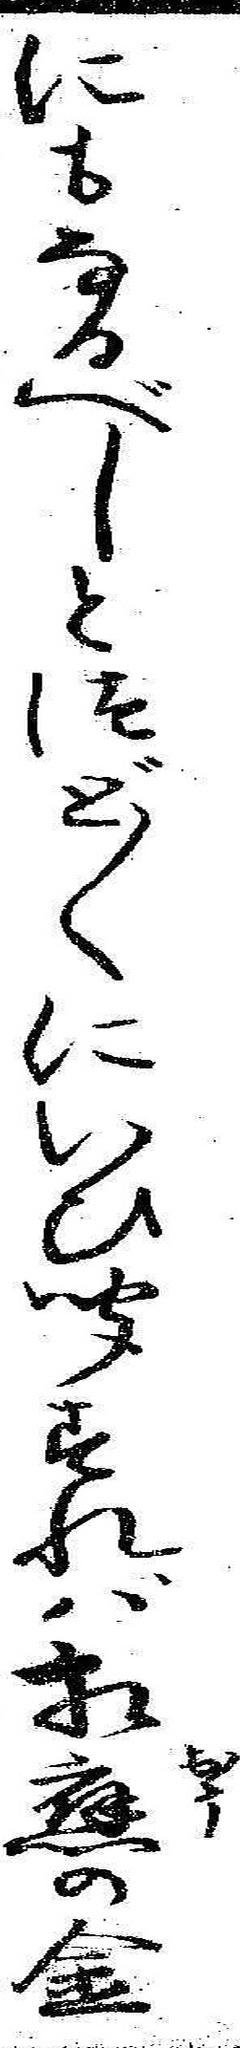にもなるべしとつど〱にいひ聞すれば相応の金
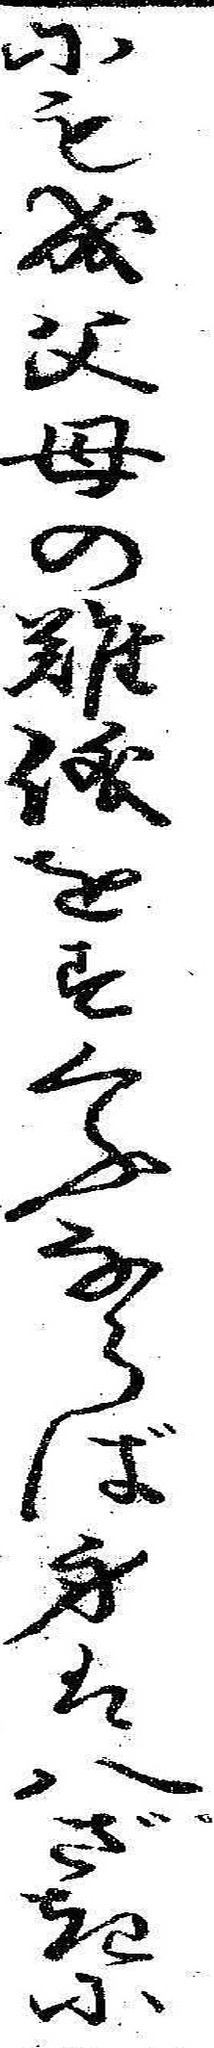にも成父母の難儀をすくふならば身は八ざきに

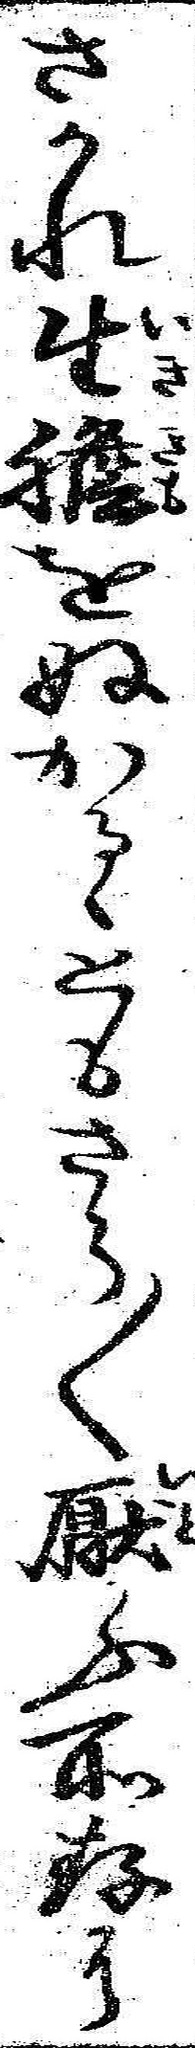さかれ生膽をぬかるゝともさら〱厭ふ所存に
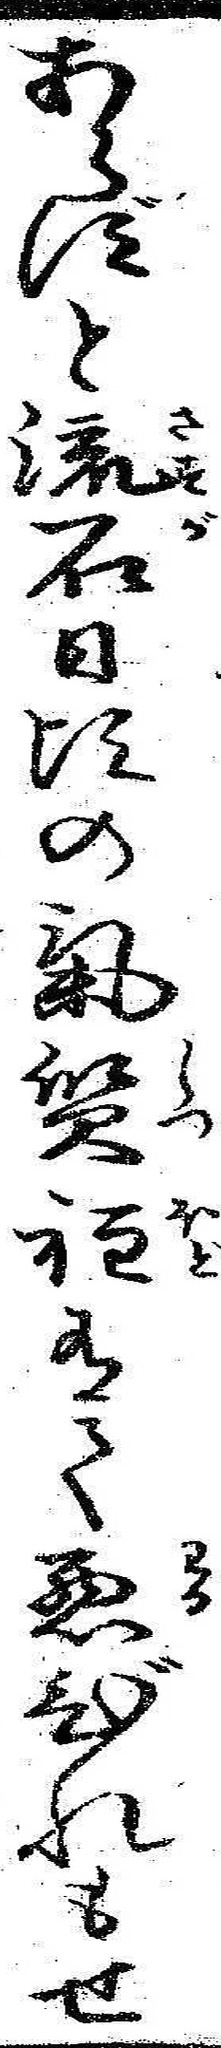あらずと流石日頃の気質程有て悪びれもせ
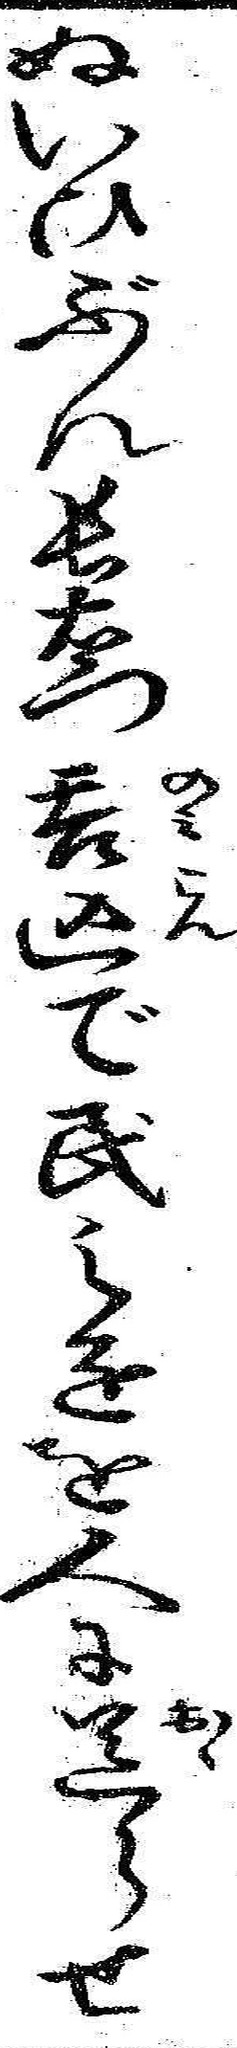ぬいひぶん長右衛門呑込で民之進を人に送らせ
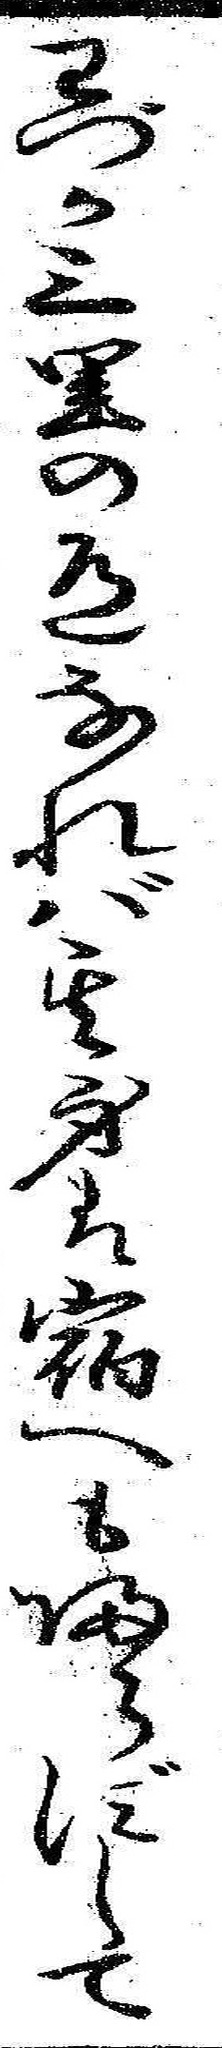わづか三里の道なれば其身は宿へも帰らずして
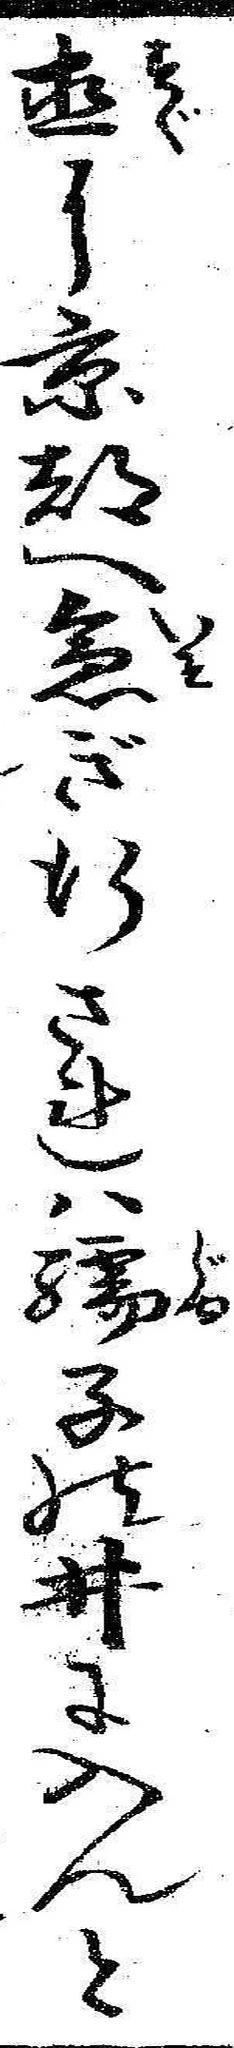直に京都へ急ぎ行されは孺子の井に入んと
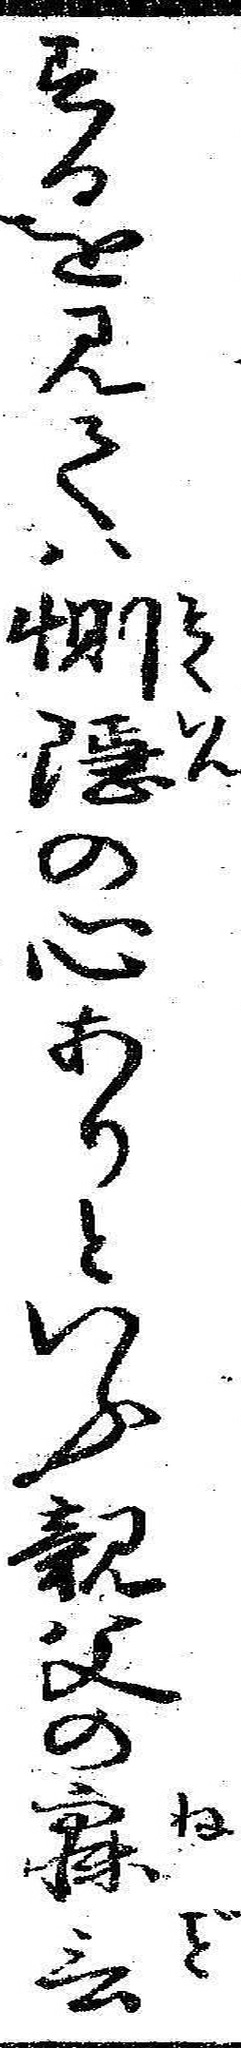するを見ては惻隠の心ありといふ親父の寝言
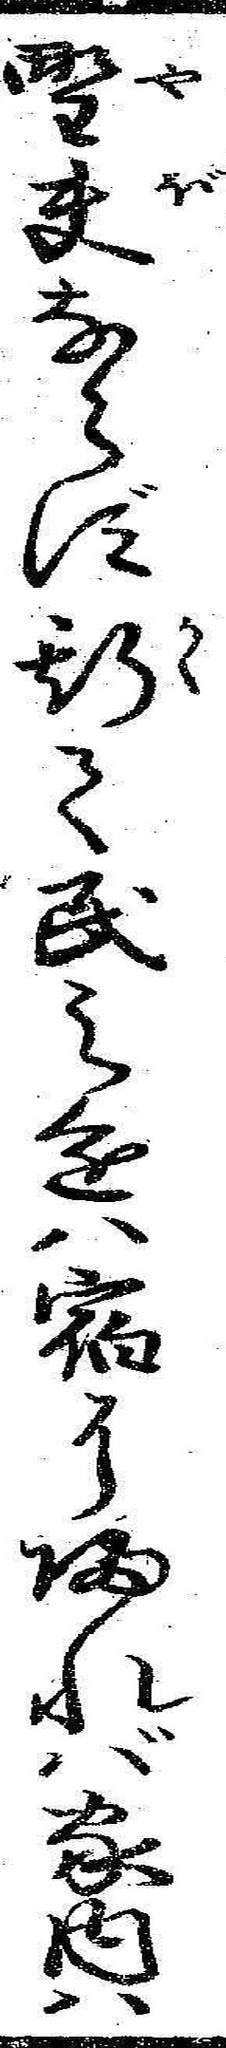野夫ならず斯て民之進は宿に帰れば家内は
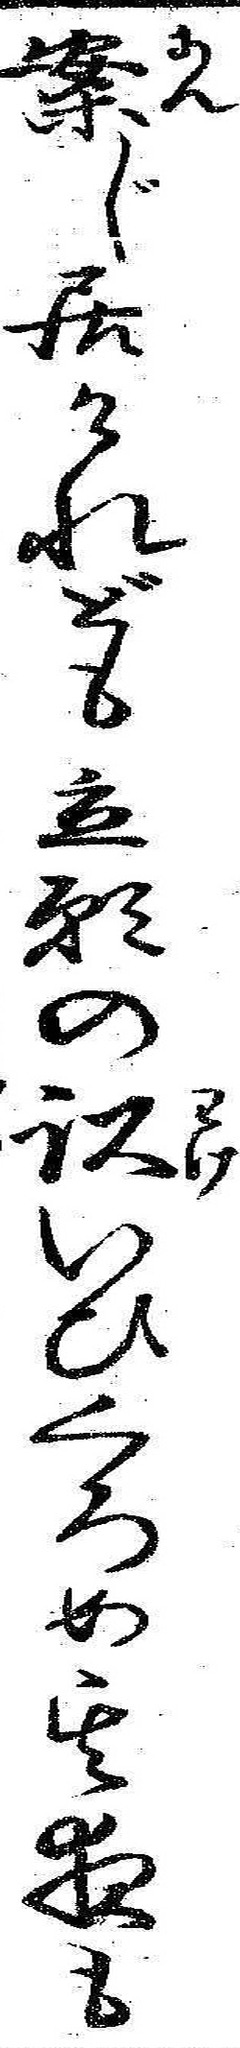案じ居けれども立願の訳いひくろめ其夜も
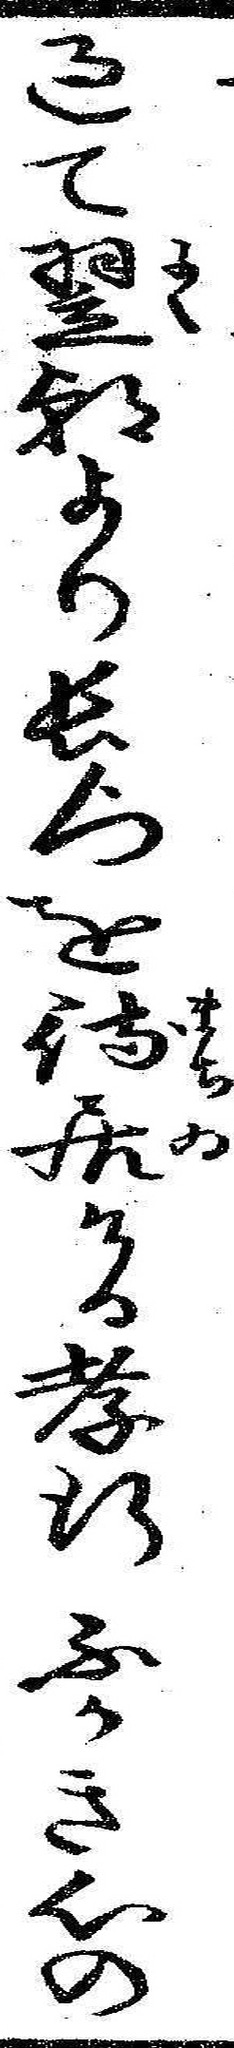過て翌朝より長右衛門を待居ける孝行ふかき心の
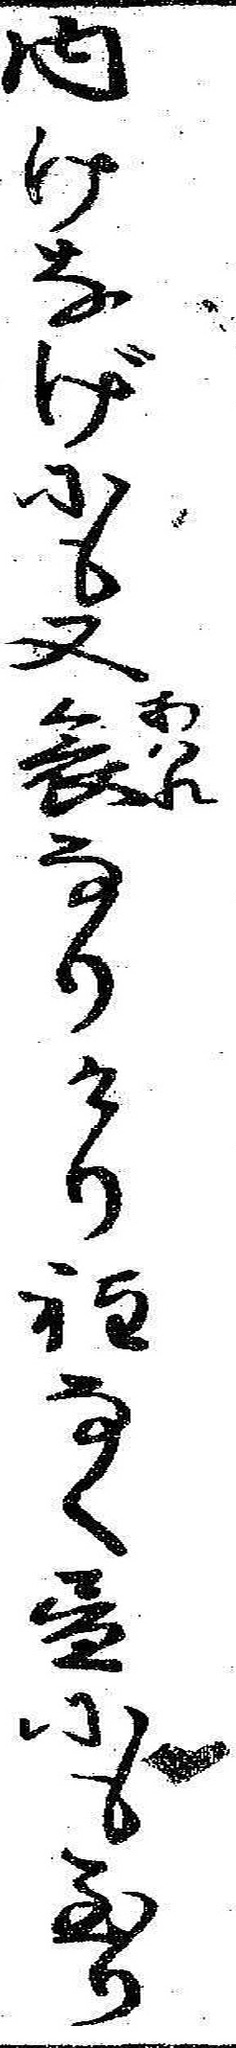内けなげにも又哀なりけり程なく昼にも至り
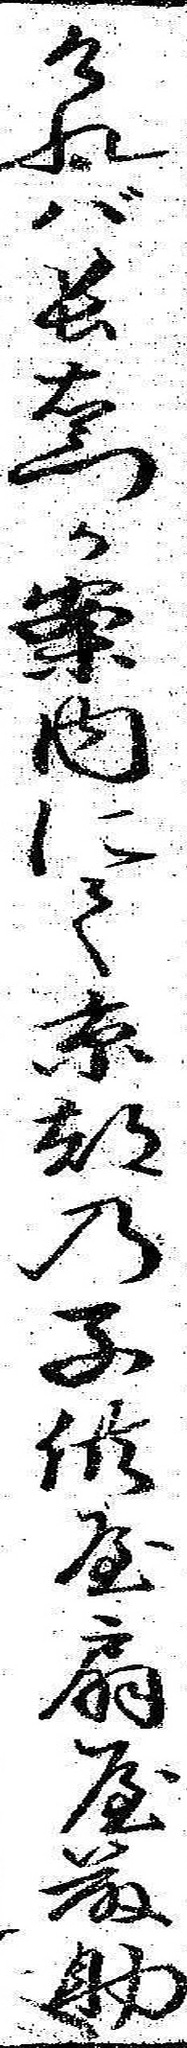ければ長右衛門か案内にて京都の子供屋扇屋藤助
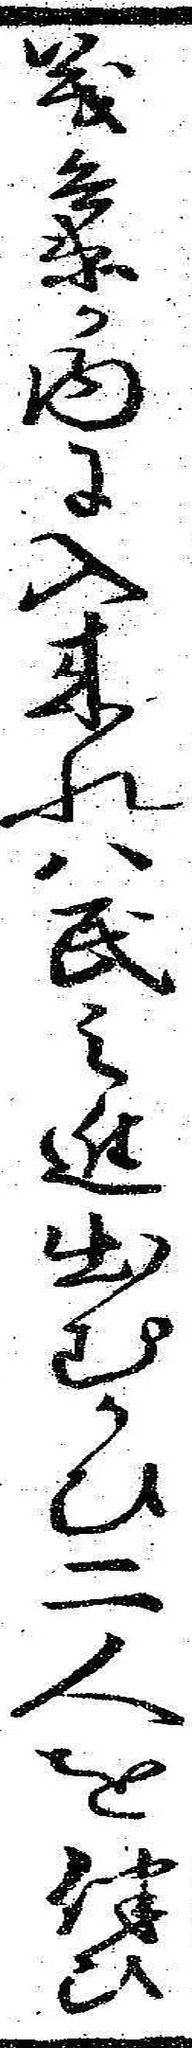義兵衛か内に入来れは民之進出むかひ二人を伴ひ
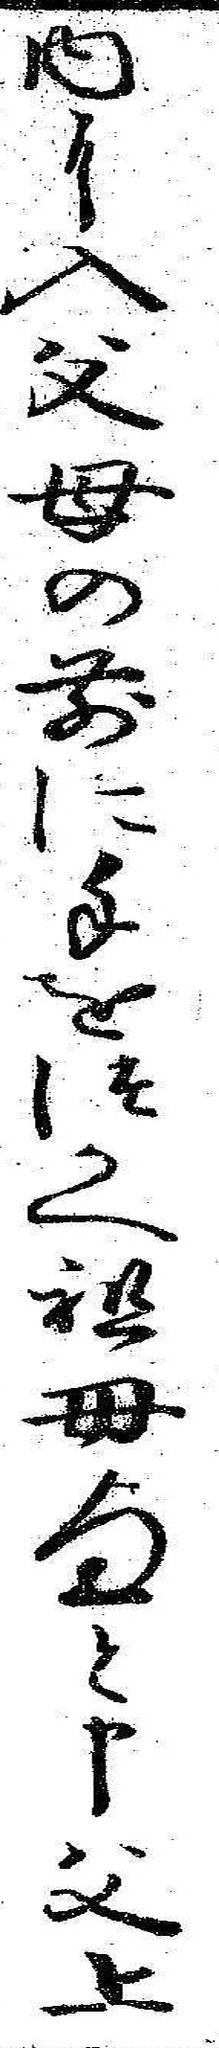内に入父母の前に手をつかへ祖母様と申父上
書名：根無草後編
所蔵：国文学研究資料館
